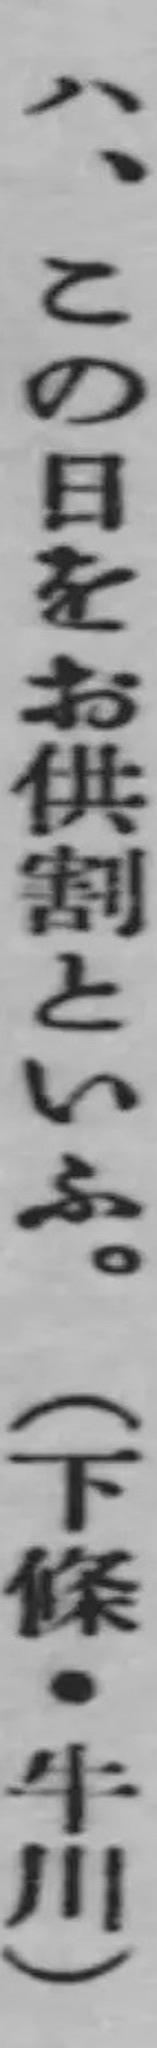ハ、この日をお供割といふ。(下條・牛川)
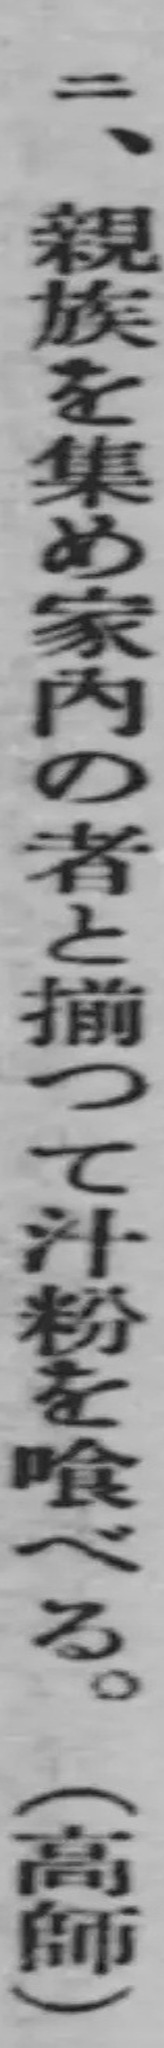ニ、親族を集め家内の者と揃つて汁粉を喰べる。(高師)
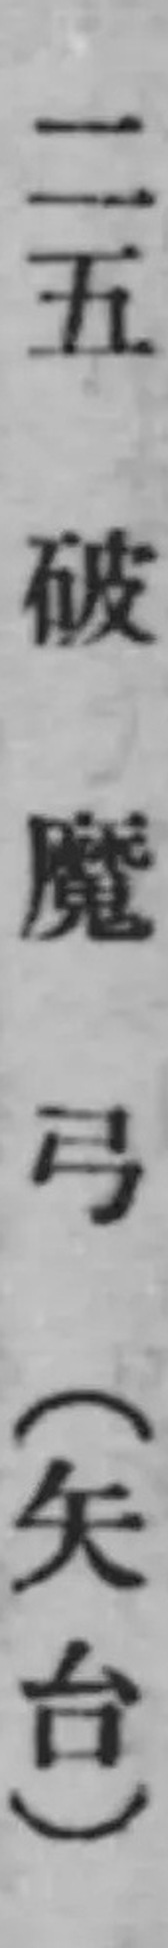二五破魔弓(矢台)
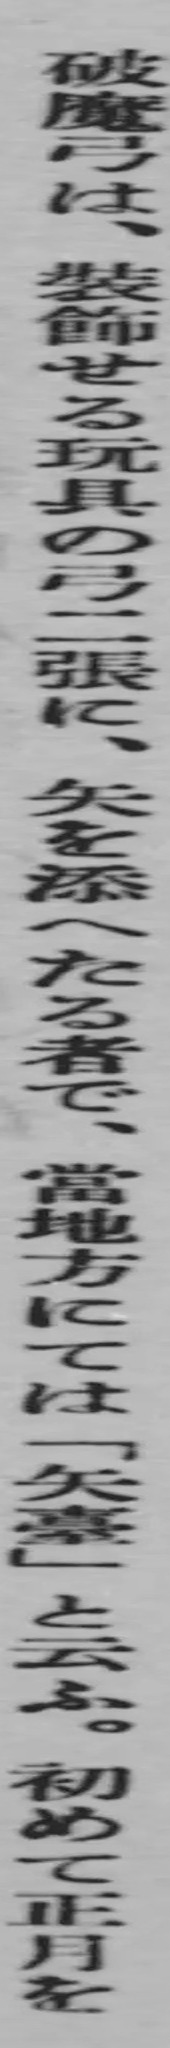破魔弓は、裝飾せる玩具の弓二張に、矢を添えたる者で、當地方にては「矢臺」と云ふ。初めて正月を
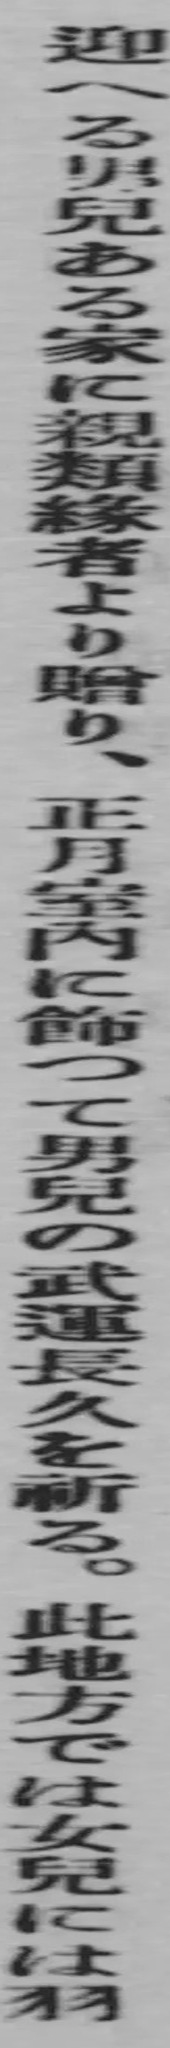迎へる男兒ある家に親類緣者より贈り、正月室内に飾つて男兒の武運長久を祈る。此地方では女兒には羽
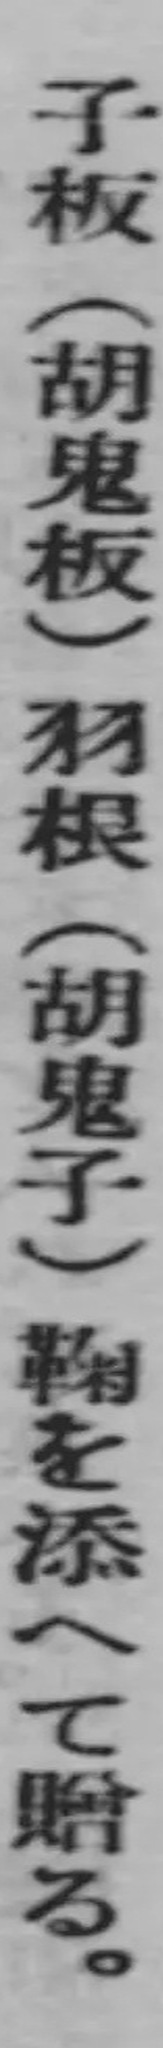子板(胡鬼板)羽根(胡鬼子)鞠を添へて贈る。
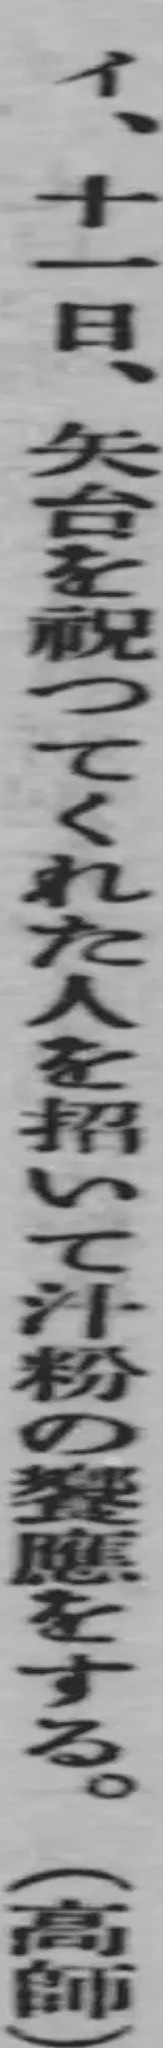イ、十一日、矢台を祝つてくれた人を招いて汁粉の饗應をする。(高師)
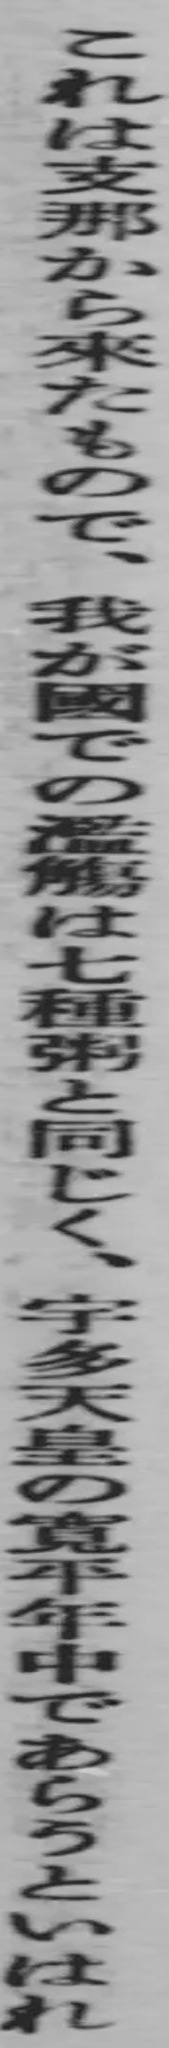これは支那から來たもので、我が國での濫觴は七種粥と同じく、宇多天皇の寛平年中であらうといはれ
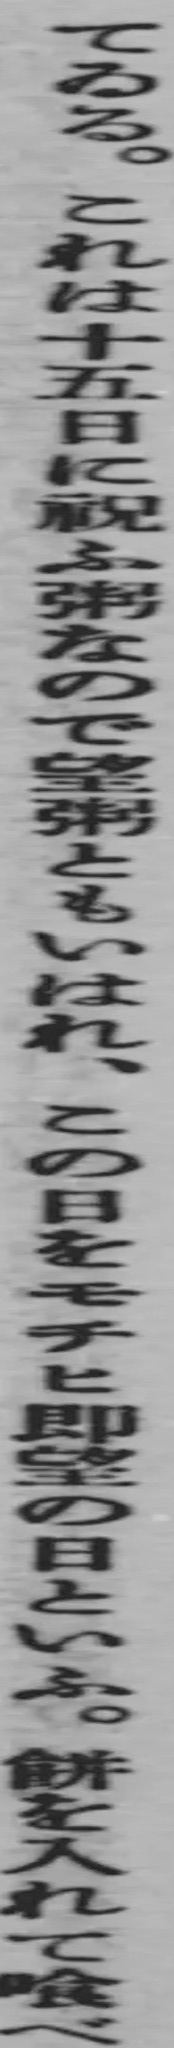てゐる。これは十五日に祝ふ粥なので望粥ともいはれ、この日をモチヒ即望の日といふ。餅を入れて喰べ
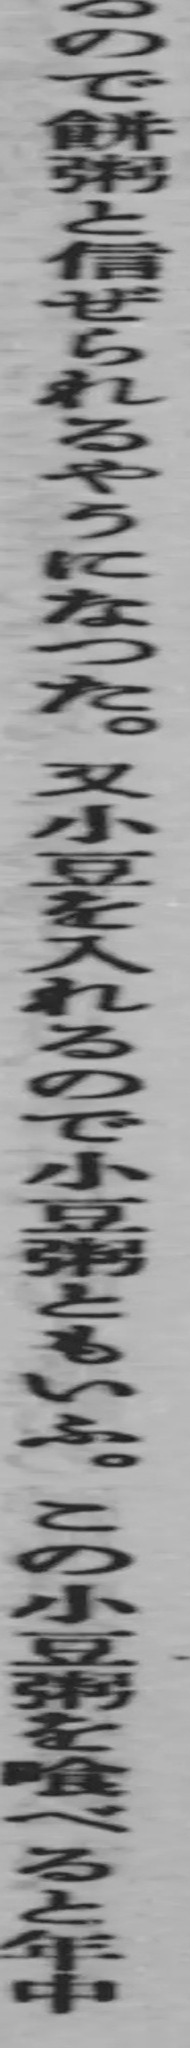るので餅粥と信ぜられるやうになつた。又小豆を入れるので小豆粥ともいふ。この小豆粥を喰べると年中
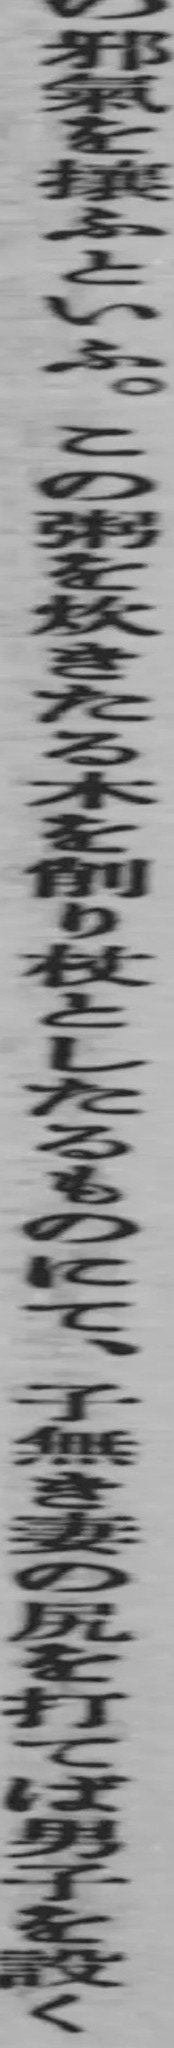の邪氣を攘ふといふ。この粥を炊きたる木を削り杖としたるものにて、子無き妻の尻を打てば男子を設く
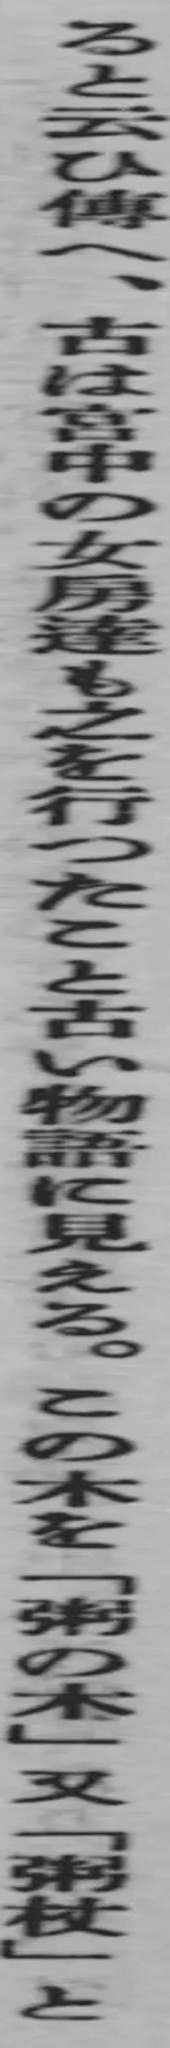ると云ひ傅へ、古は宮中の女房達も之を行つたこと古い物語に見える。この木を「粥の木」又「粥杖」と
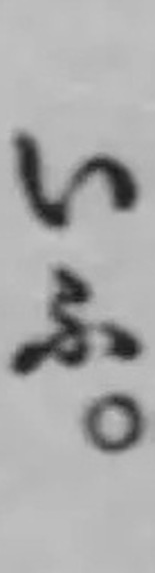いふ。
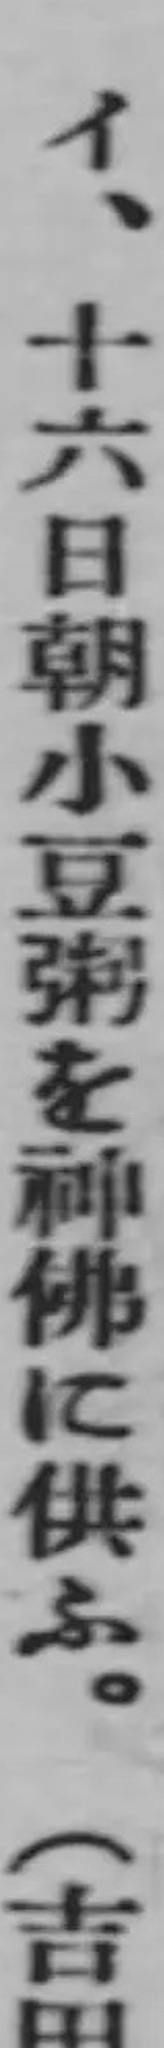イ、十六日朝小豆粥を神佛に供ふ。(吉田方)
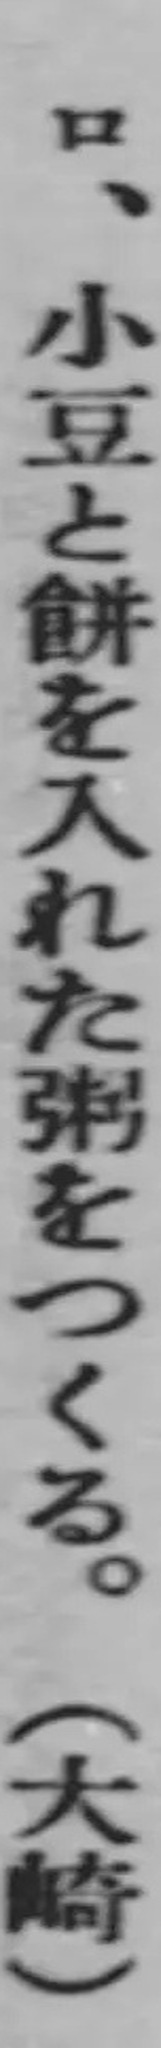ロ、小豆と餅を入れた粥をつくる。(大崎)
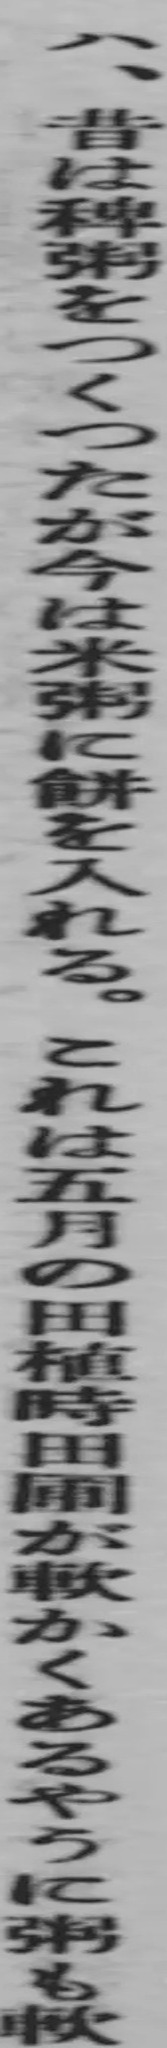ハ、昔は稗粥をつくつたが今は米粥に餅を入れる。これは五月の田植時田圃が軟かくあるやうに粥も軟
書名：豊橋の年中行事
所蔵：国立国会図書館 National Diet Library, JAPAN
